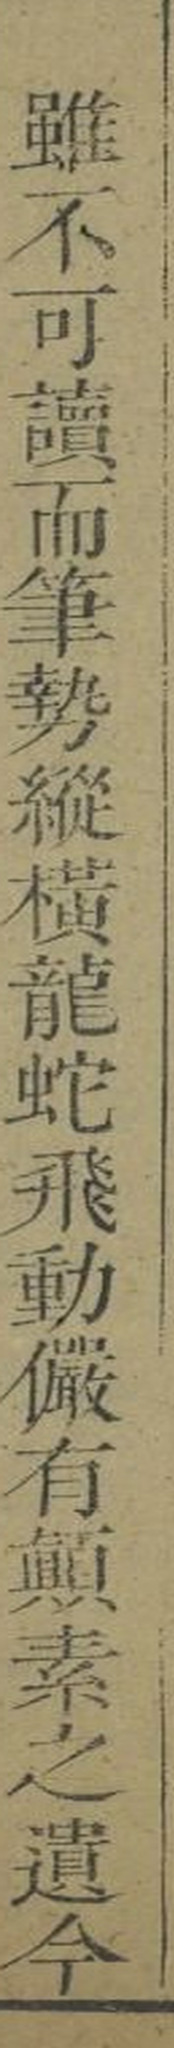雖不可読而筆勢縦横竜蛇飛動儼有顛素之遺今
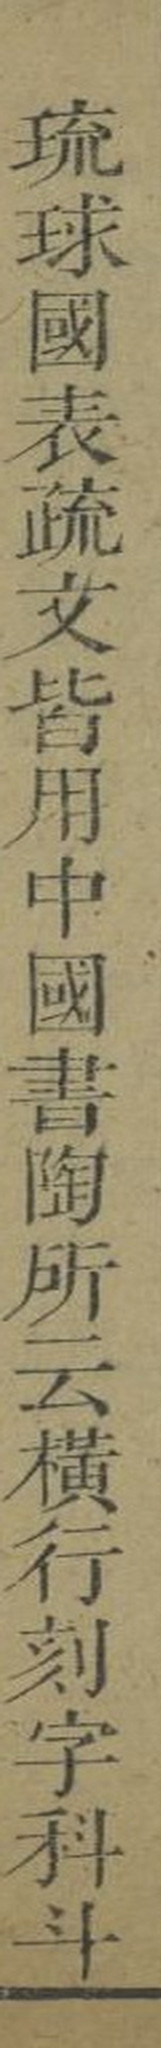琉球国表疏文皆用中国書陶所云横行刻字科斗
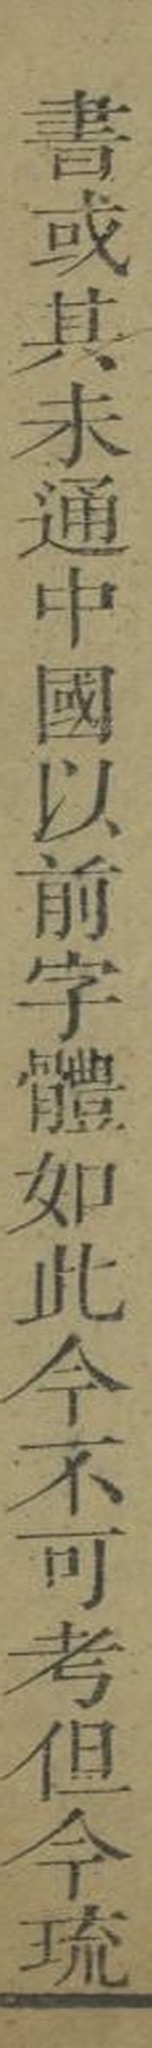書或其未通中国以前字体如此今不可考但今琉
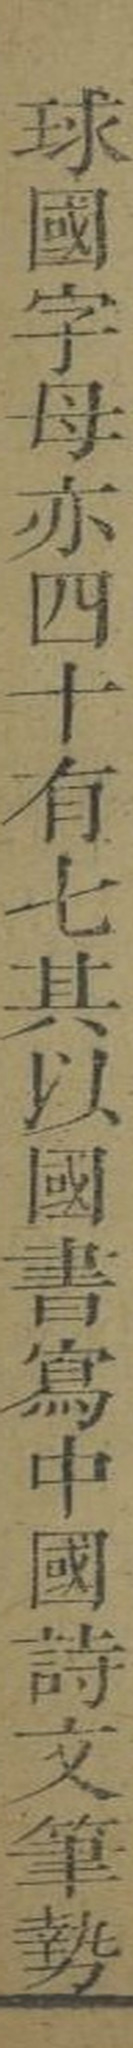球国字母亦四十有七其以国書写中国詩文筆勢

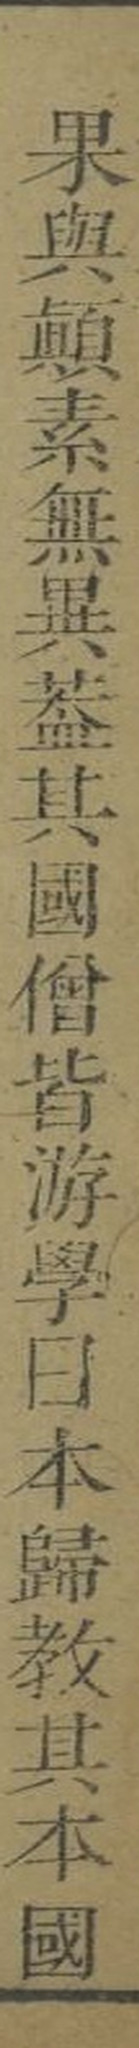果与顚素無異葢其国僧皆游学日本帰教其本国
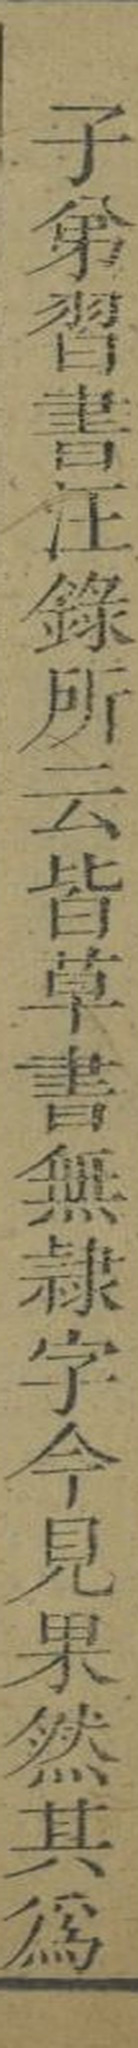子弟習書汪録所云皆草書無隷字今見果然其為
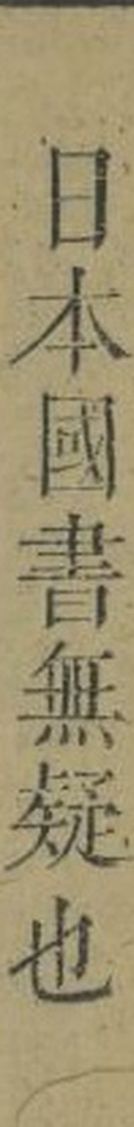日本国書無疑也
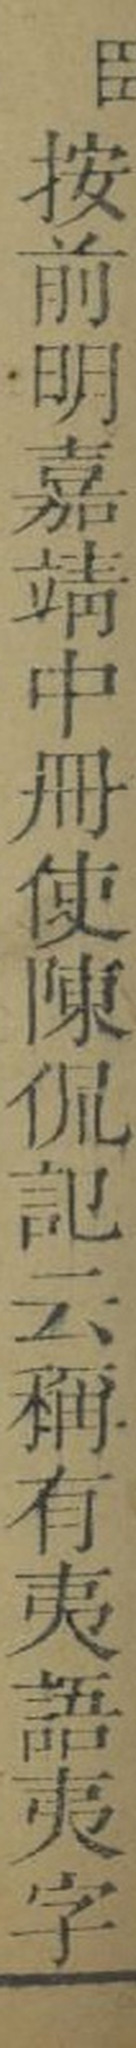臣按前明嘉靖中冊使陳侃記云称有夷語夷字
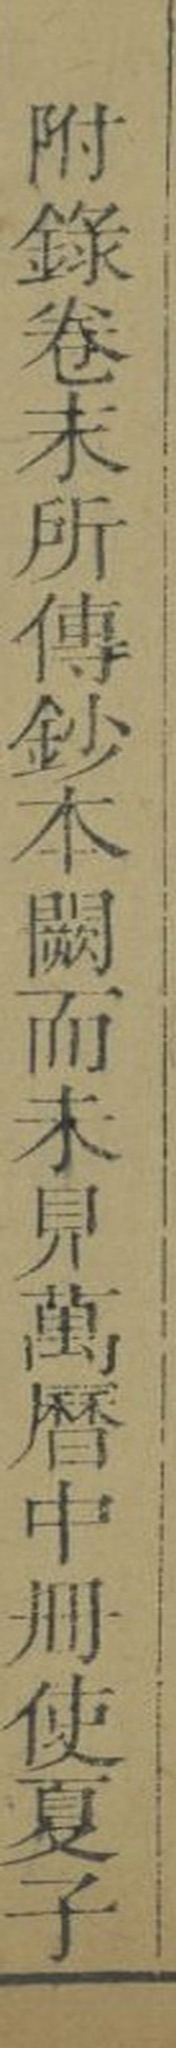附録巻末所伝鈔本闕而未見万暦中冊使夏子
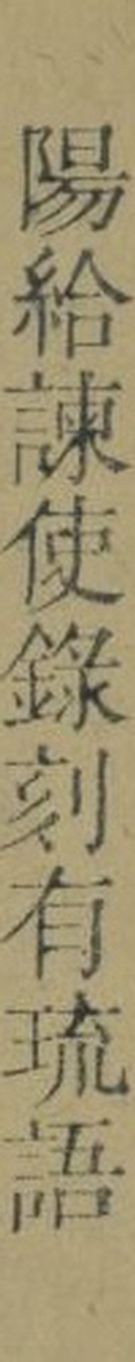陽給諫使録刻有琉語
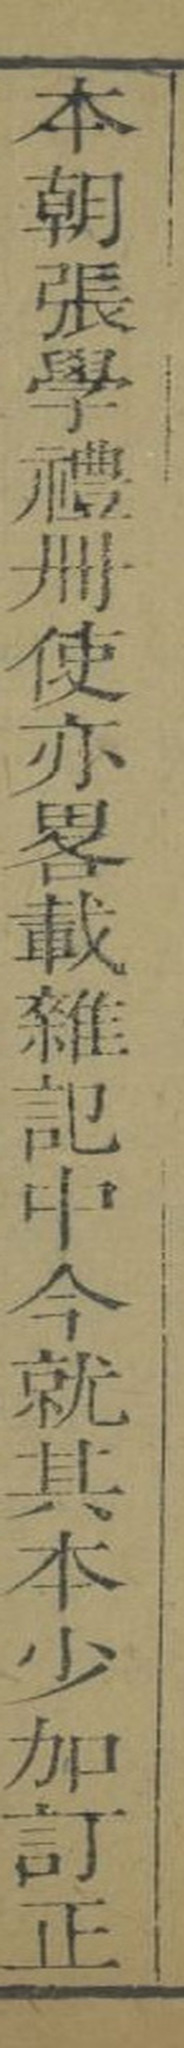本朝張学礼冊使亦略載雑記中今就其本少加訂正
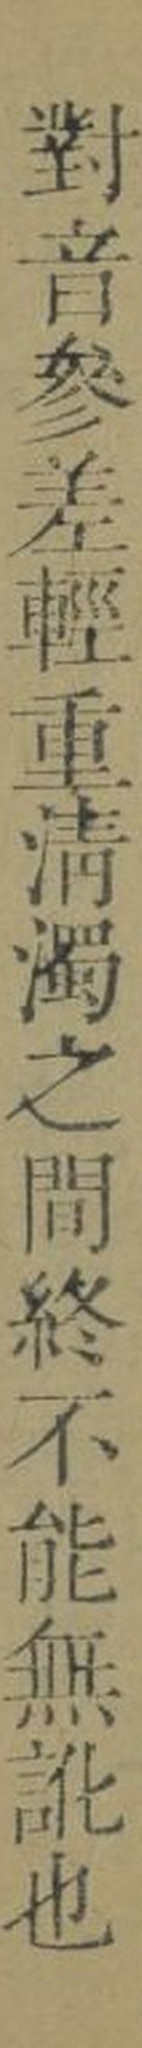対音参差軽重清濁之間終不能無訛也

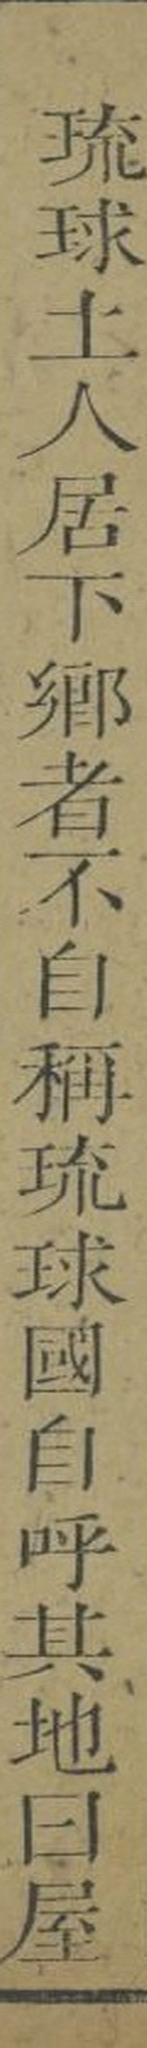琉球土人居下郷者不自称琉球国自呼其地曰屋
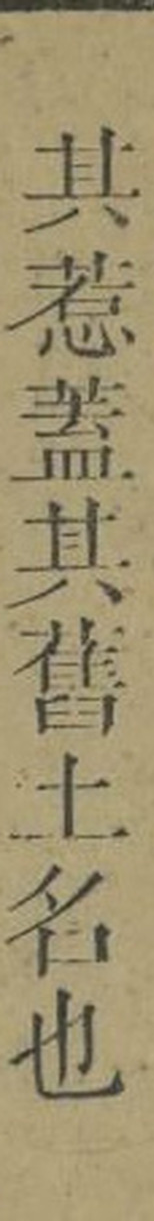其惹蓋其旧土名也
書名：中山伝信録 巻六
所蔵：University of the Ryukyus Library
